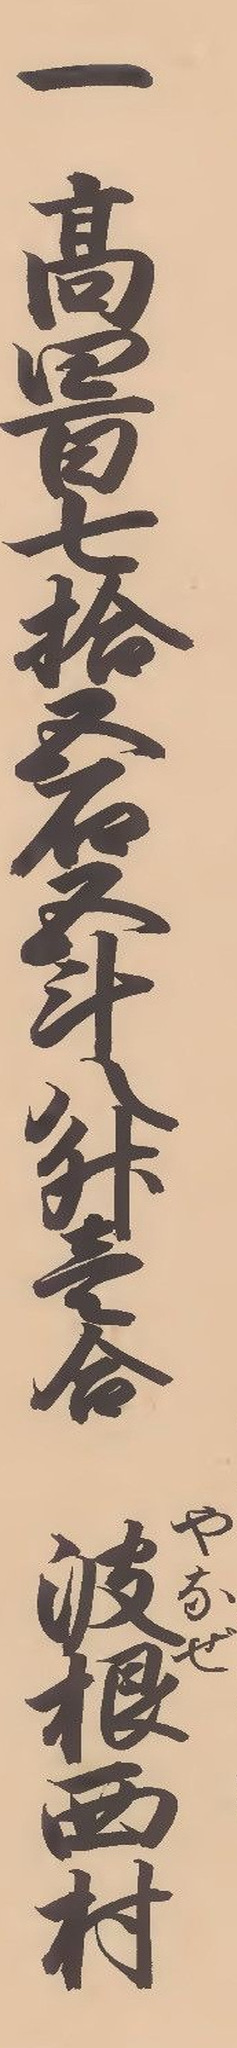一高四百七拾五石五斗八升壱合波根西村
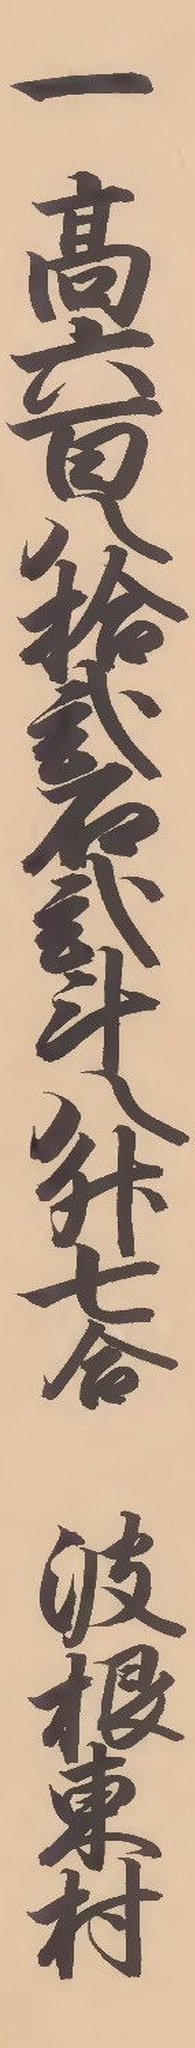一高六百八拾弐石弐斗八升七合波根東村

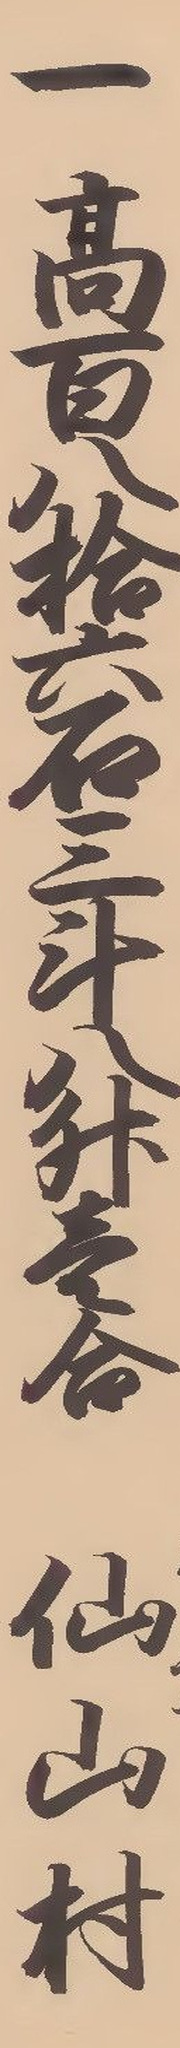一高百八拾六石三斗八升壱合仙山村
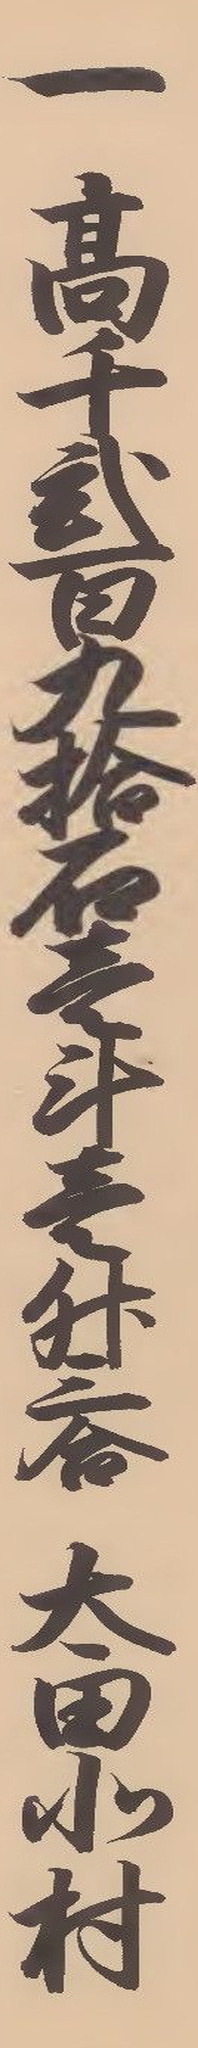一高千弐百九拾石壱斗壱升三合太田北村
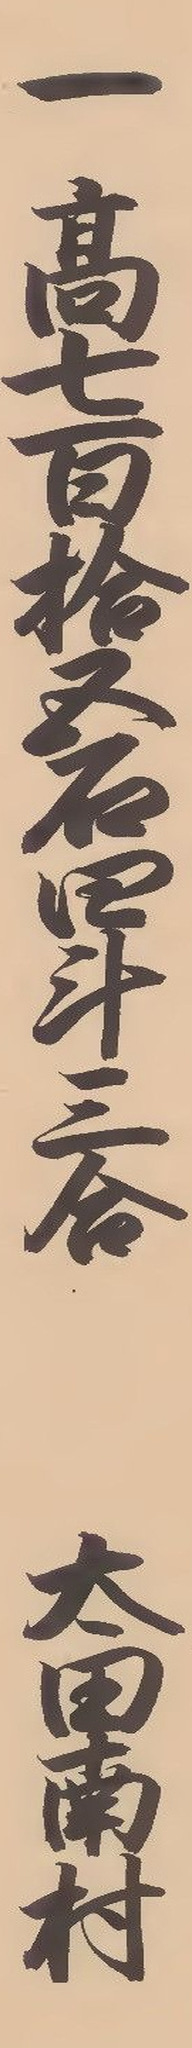一高七百拾五石四斗三合太田南村
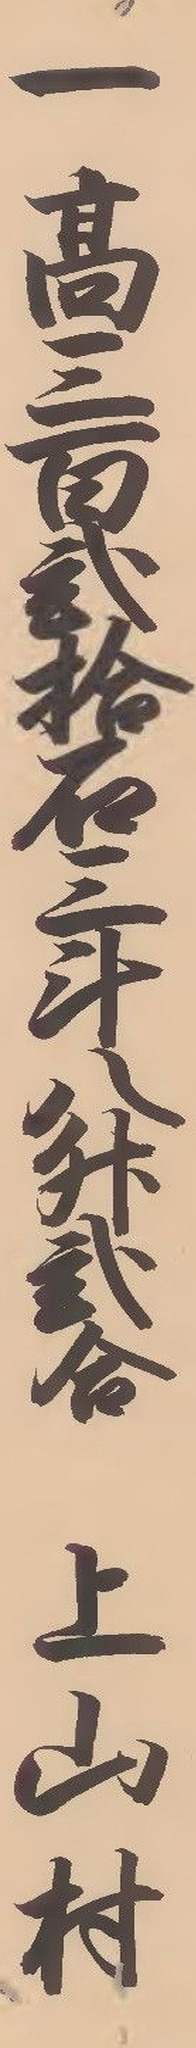一高三百弐拾石三斗八升弐合上山村
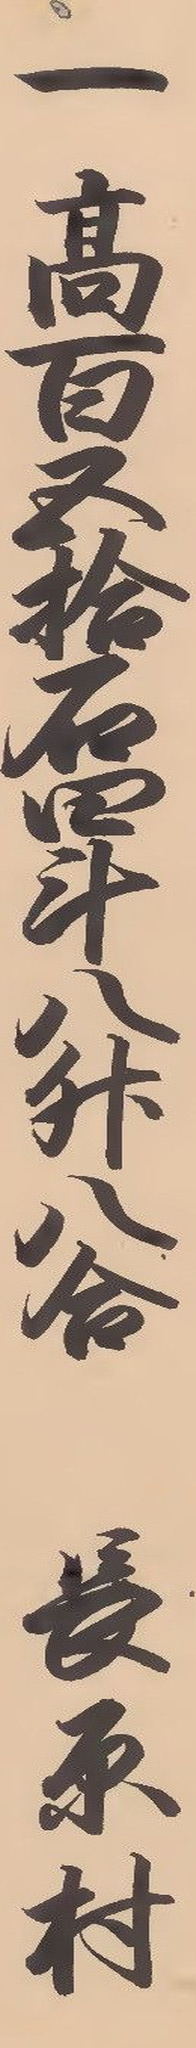一高百五拾石四斗八升八合長原村
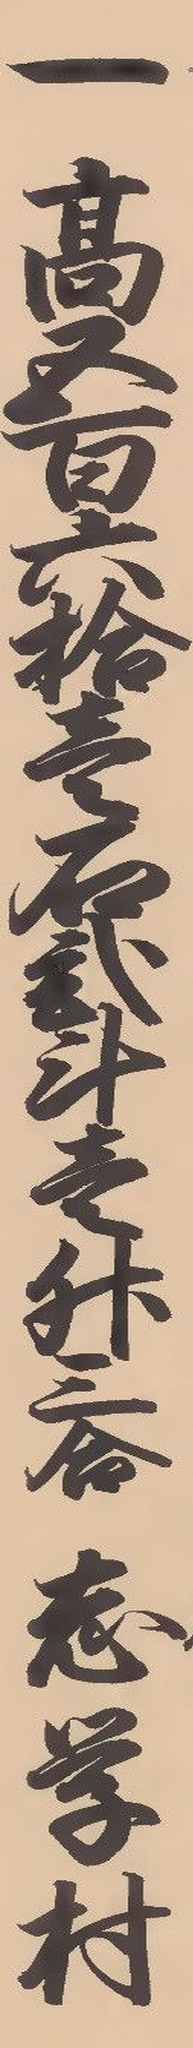一高五百六拾壱石弐斗壱升三合志学村
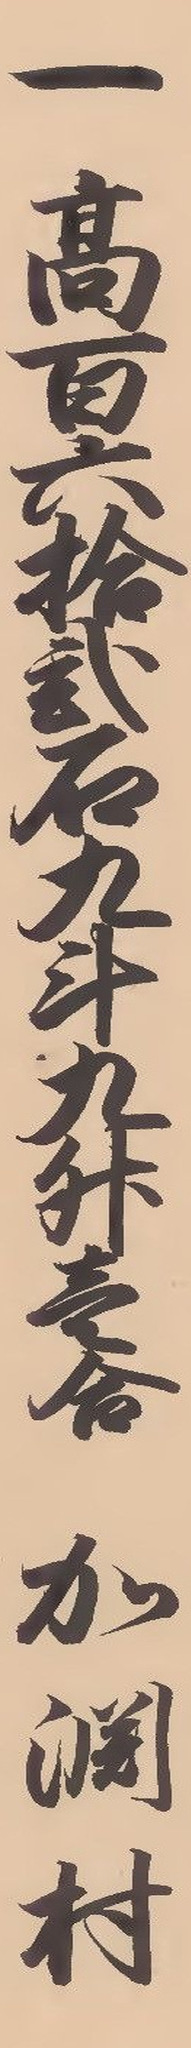一高百六拾弐石九斗九升壱合加淵村
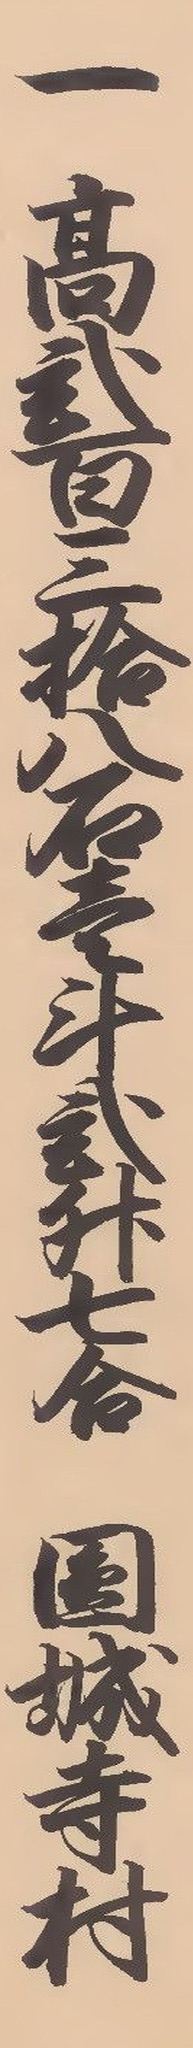一高弐百三拾八石壱斗弐升七合圓城寺村

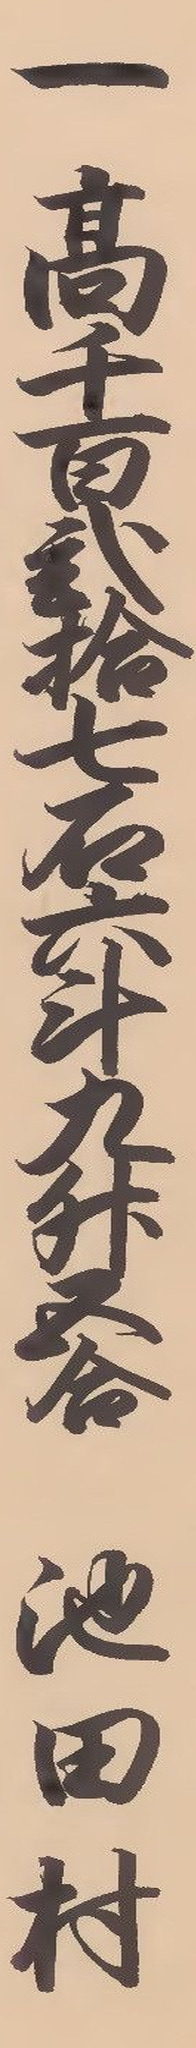一高千百弐拾七石六斗九升五合池田村
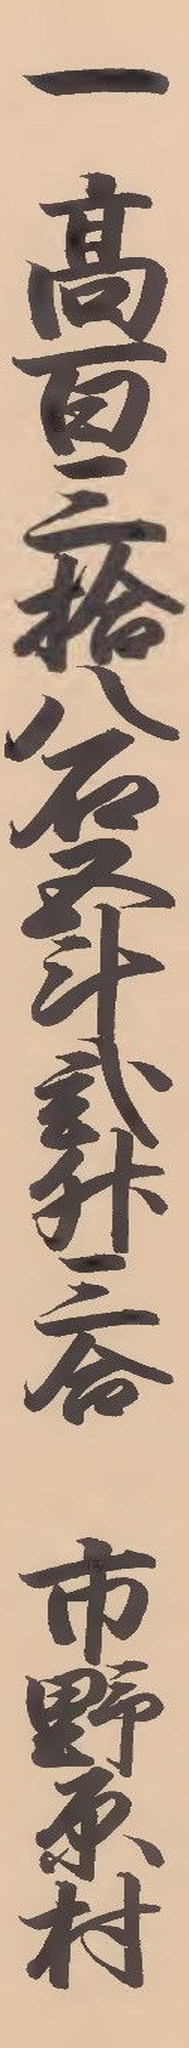一高百三拾八石五斗弐升三合市野原村
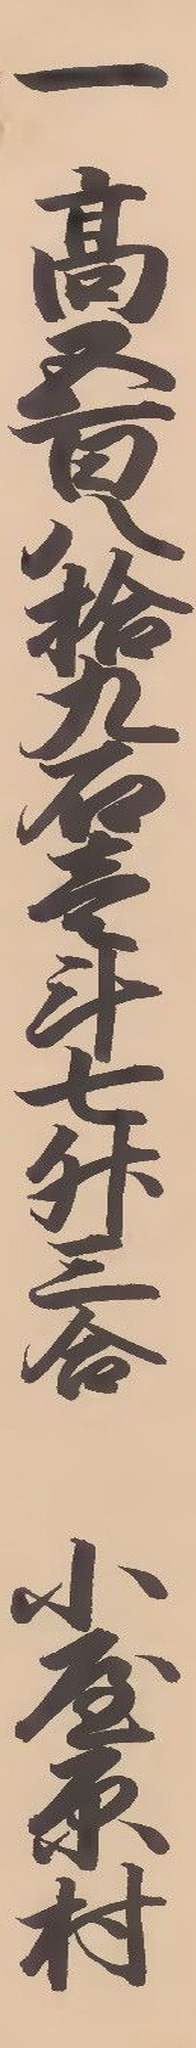一高五百八拾九石壱斗七升三合小屋原村
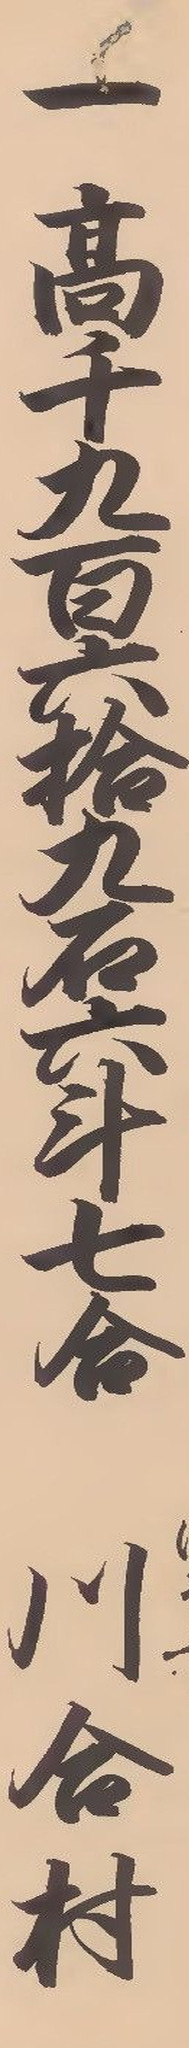一高千九百六拾九石六斗七合川合村
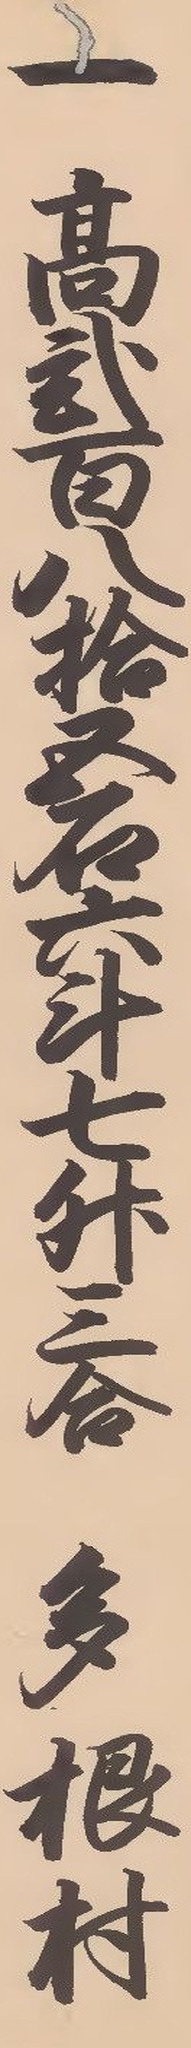一高弐百八拾五石六斗七升三合多根村
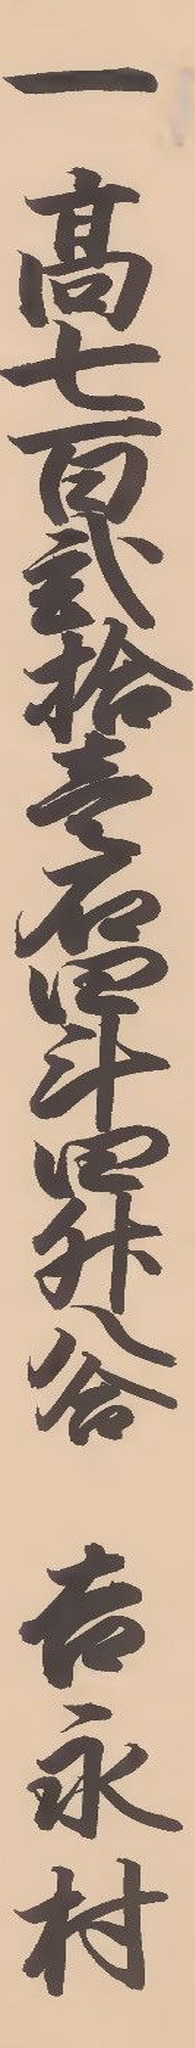一高七百弐拾壱石四斗四升八合吉永村
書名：石見国郷帳
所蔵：国立公文書館 National Archives of Japan
